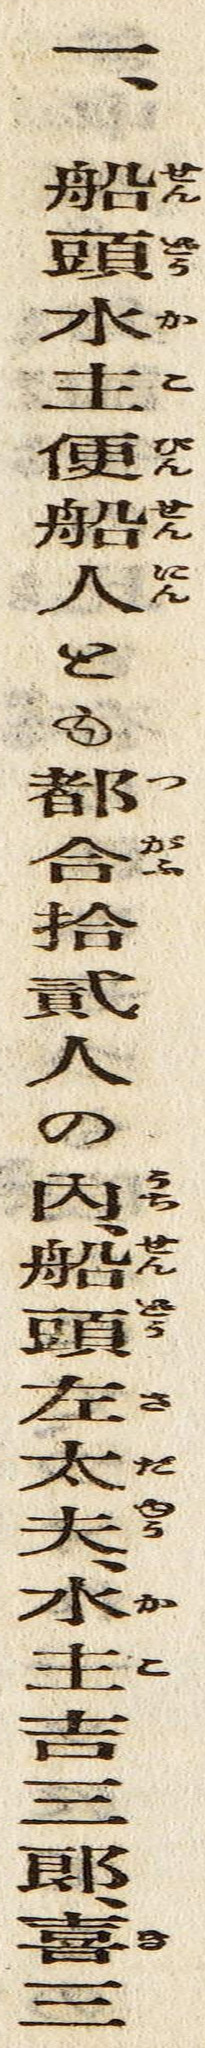一、船頭水主便船人とも都合拾弐人の内、船頭左太夫、水主吉三郎、喜三
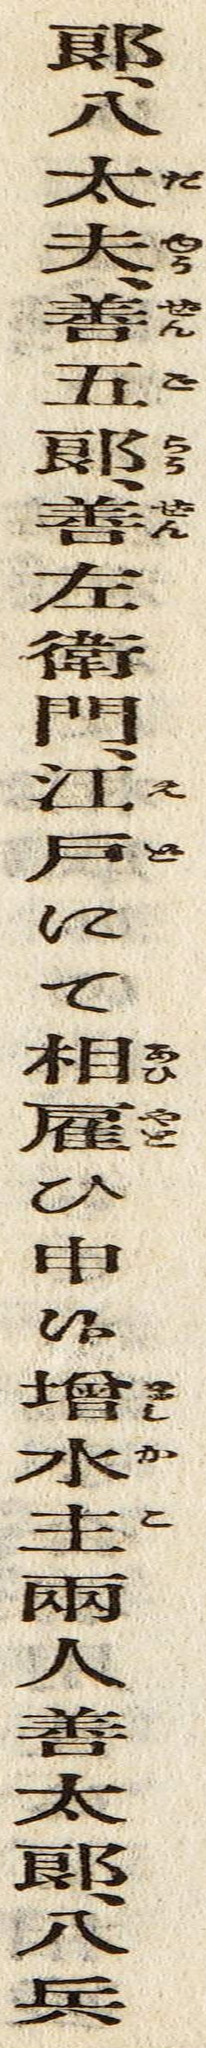郎、八太夫、善五郎、善左衛門、江戸にて相雇ひ申候増水主両人善太郎、八兵
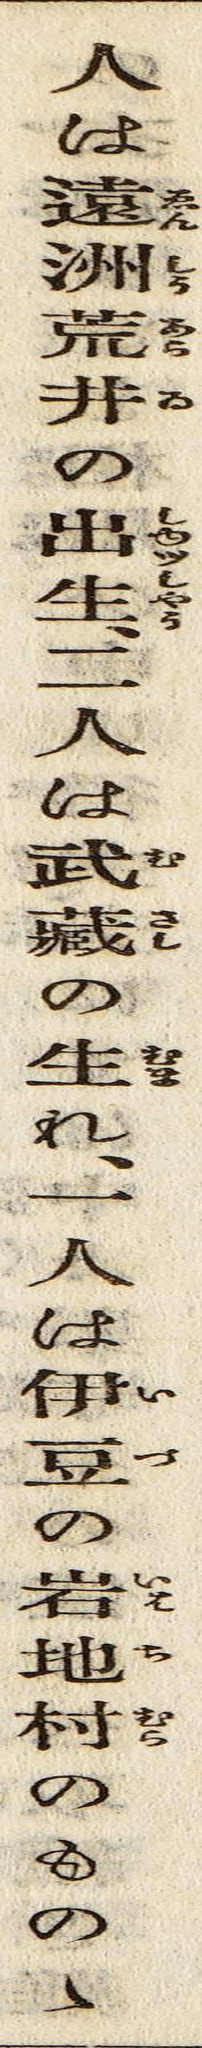人は遠洲荒井の出生、二人は武蔵の生れ、一人は伊豆の岩地村のものゝ
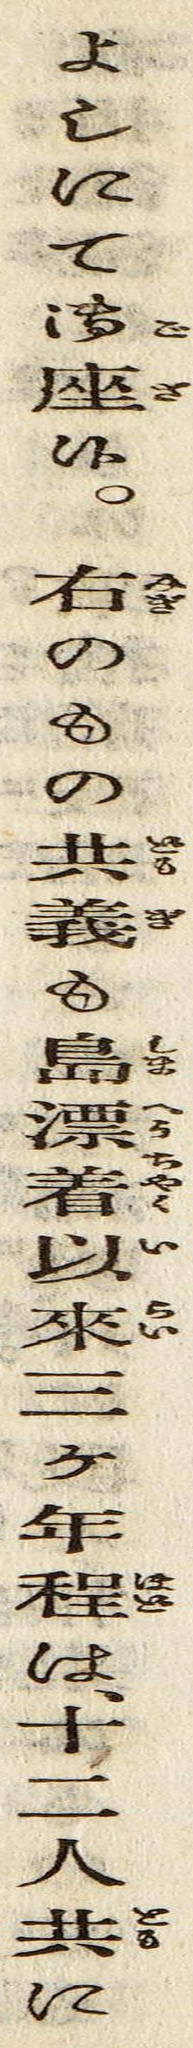よしにて御座候。右のもの共義も島漂着以来三ケ年程は、十二人共に
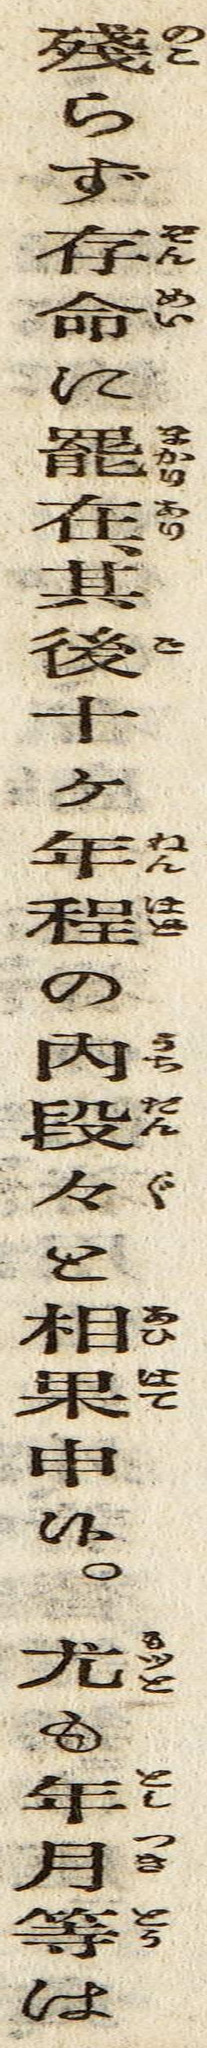残らず存命に罷在、其後十ケ年程の内段々と相果申候。尤も年月等は
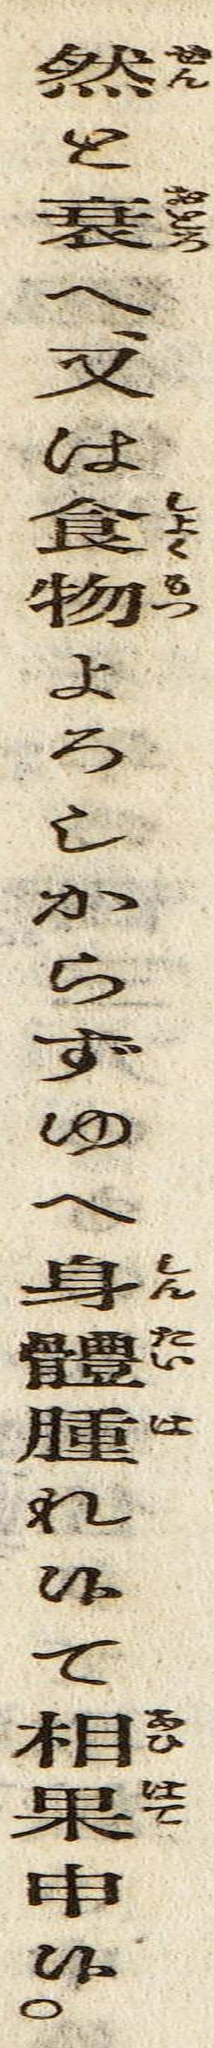然と衰へ、又は食物よろしからずゆへ身体腫れ候て相果申候。

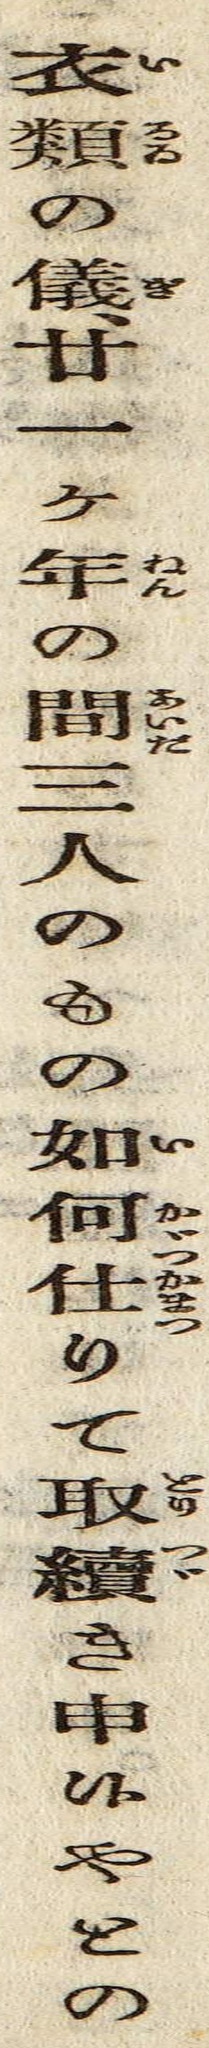衣類の儀、廿一ケ年の間三人のもの如何仕りて取続き申候やとの
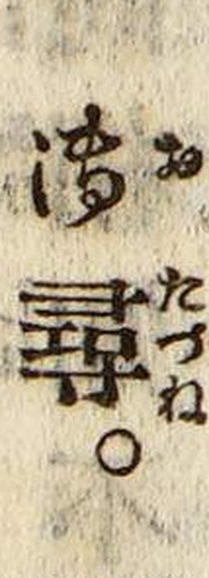御尋。
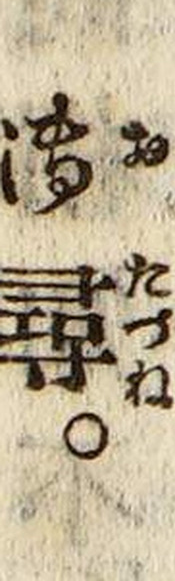御尋。
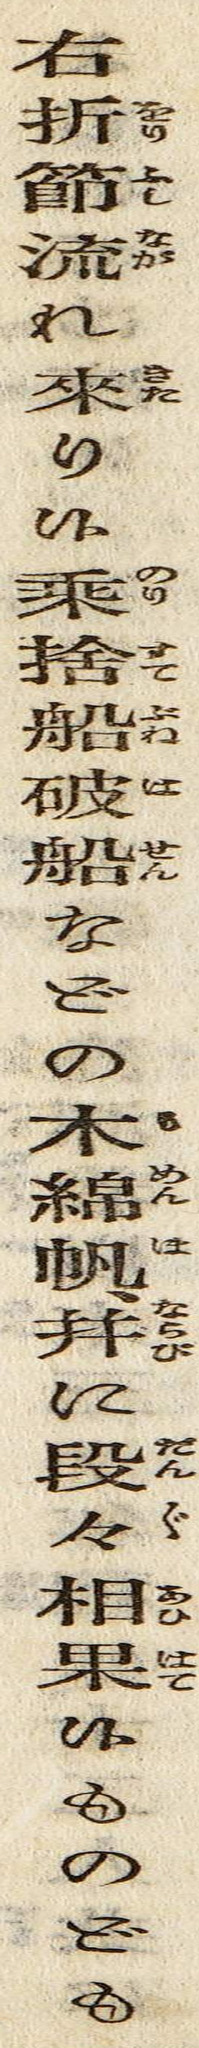右折節流れ来り候乗捨船破船などの木綿帆、并に段々相果候ものども
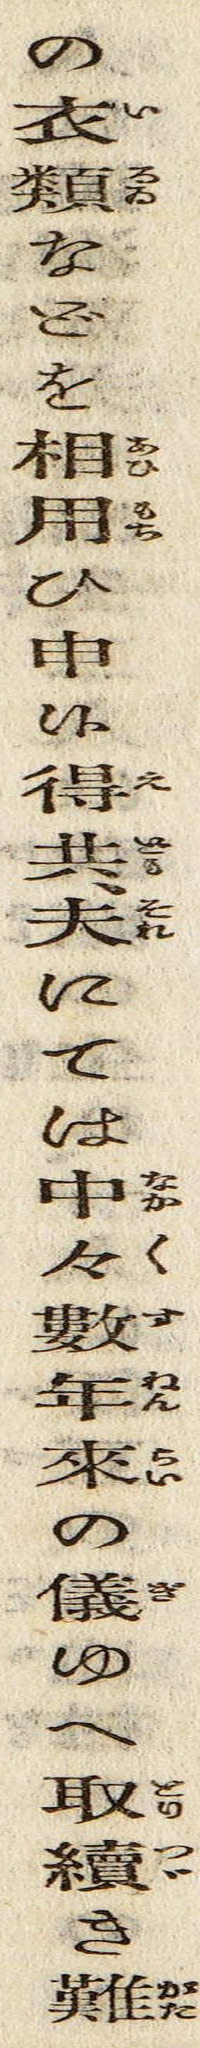の衣類などを相用ひ申候得共、夫にては中々数年来の儀ゆへ取続き難
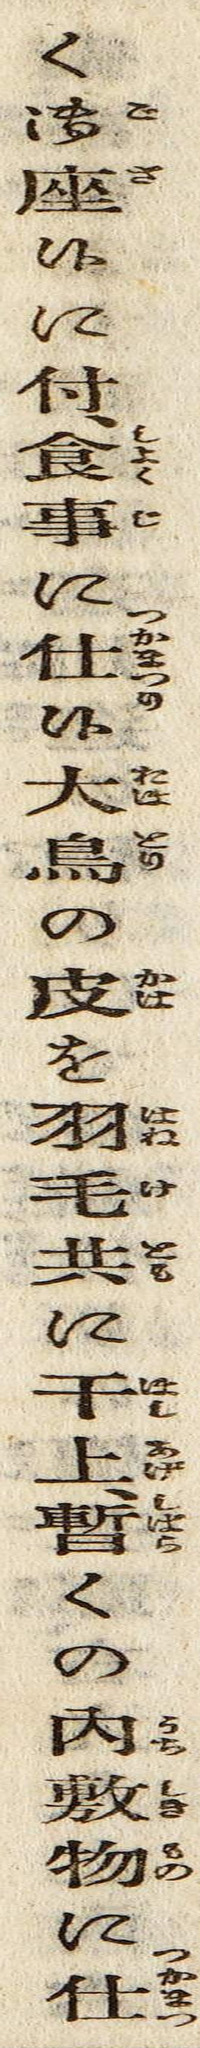く御座候に付、食事に仕候大鳥の皮を羽毛共に干上、暫くの内敷物に仕
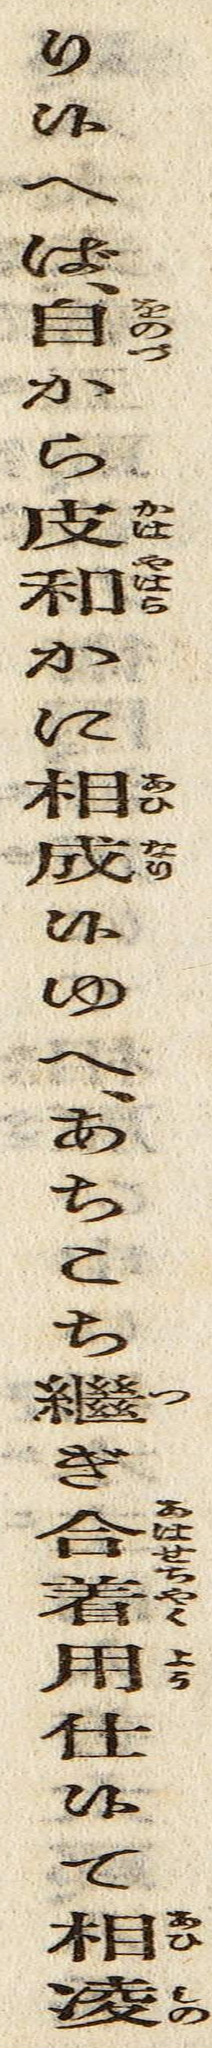り候へば、自から皮和かに相成候ゆへ、あちこち継ぎ合着用仕候て相凌
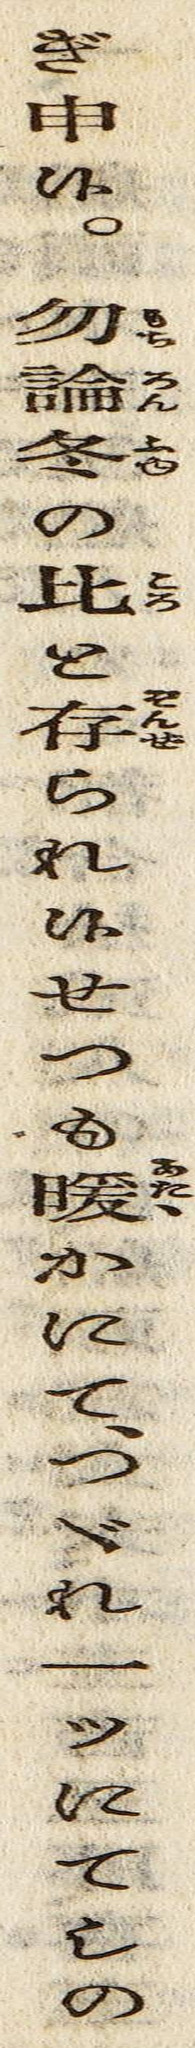ぎ申候。勿論冬の比と存られ候せつも暖かにて、つヾれ一ツにてしの
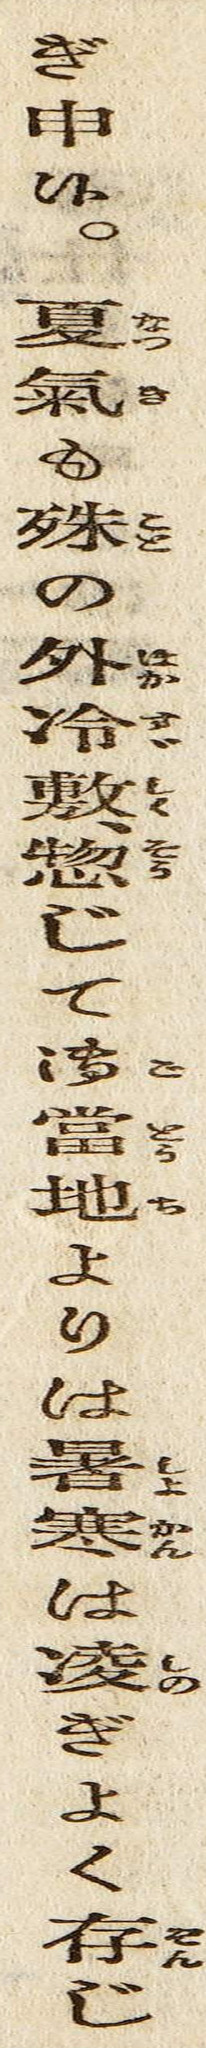ぎ申候。夏気も殊の外冷敷、総じて御当地よりは暑寒は凌ぎよく存じ
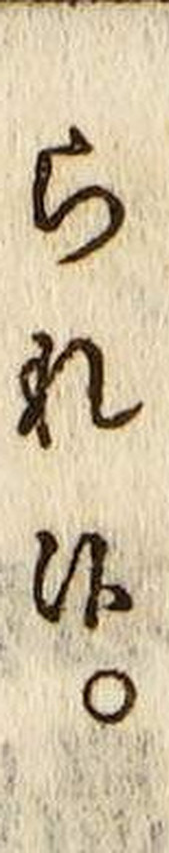られ候。
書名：日本漂流譚
